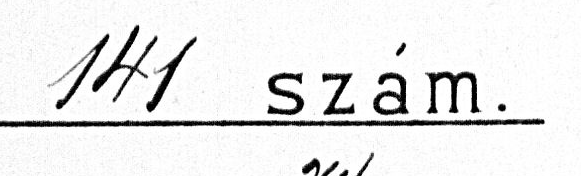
141 szám.
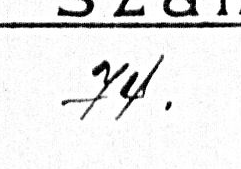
74.
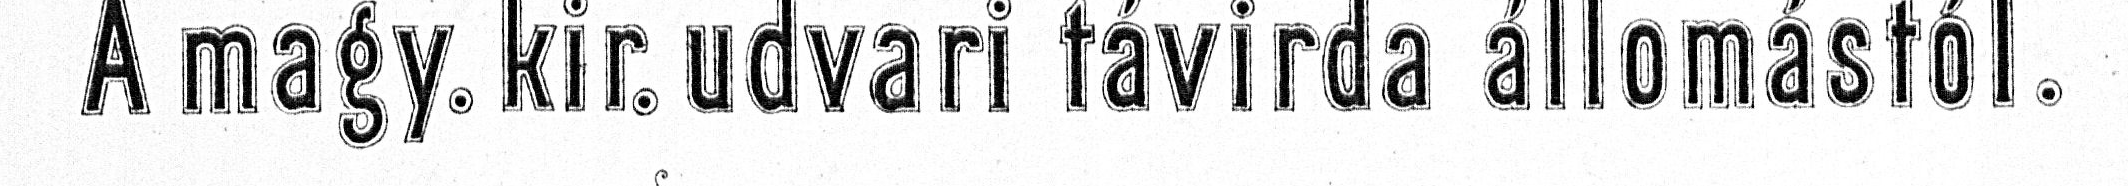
A magy. kir. udvari távirda állomástól.
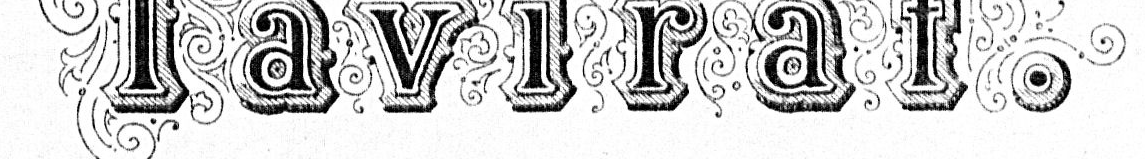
Távirat.
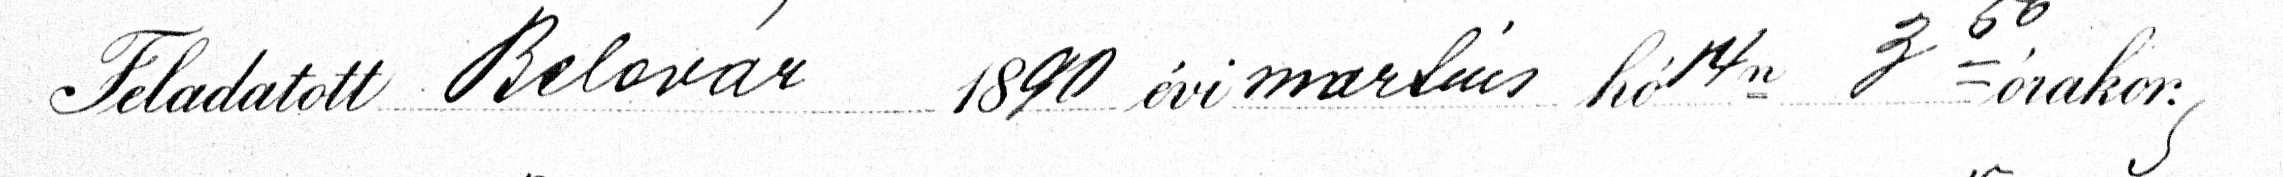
Feladatott Belovár 1890 évi martius hó 14n 3 50 órakor.
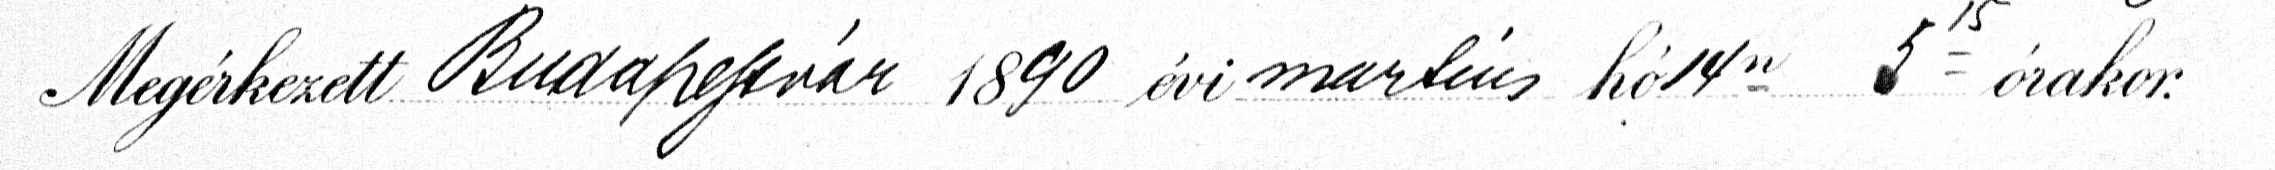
Megékezett Budapestvár 1890 évi martius hó 14n 5 15 órakor.
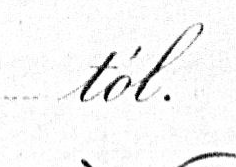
tól.
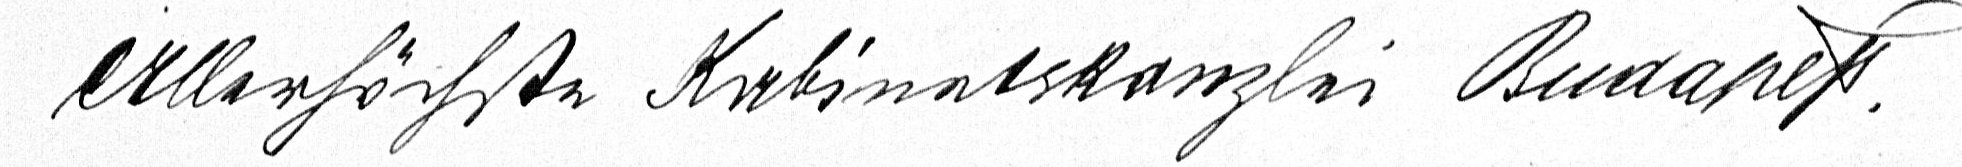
Allerhöchste Kabinetskanzlei Budapest.
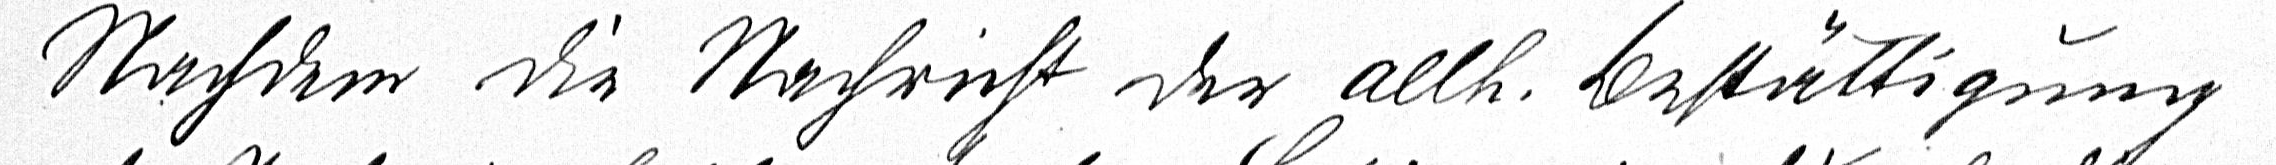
Nachdem die Nachricht der allh. Bestättigung
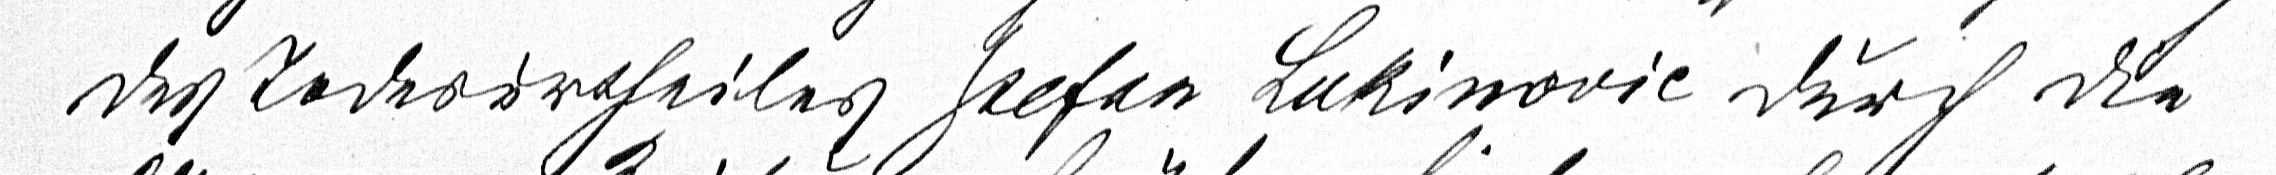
des Todesurtheiles Stefan Lukinovic durch die
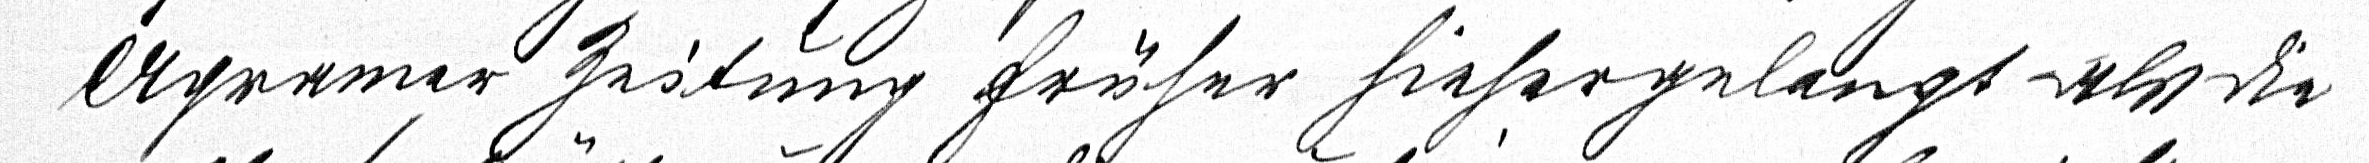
Agramer Zeitung früher hiehergelangt als die
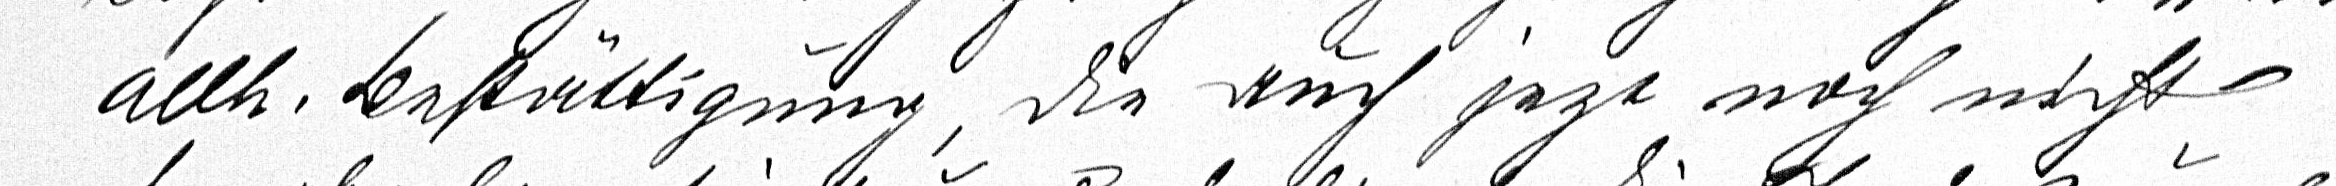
allh.Bestättigung, die auch jezt noch nicht
